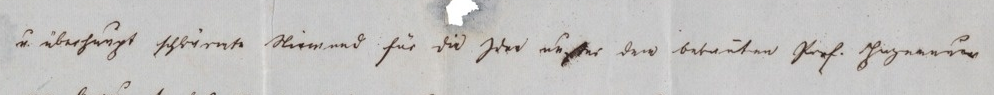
u. überhaupt schwärmte Niemand für die Idee außer dem bekannten Prof. Hagenauer
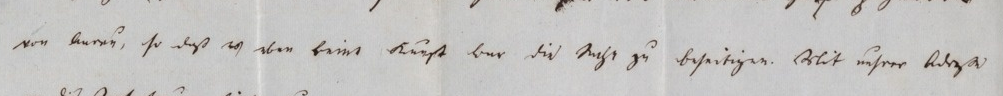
von Aarau, so daß es eben keine Kunst war die Sache zu beseitigen. Mit unsrer Adresse
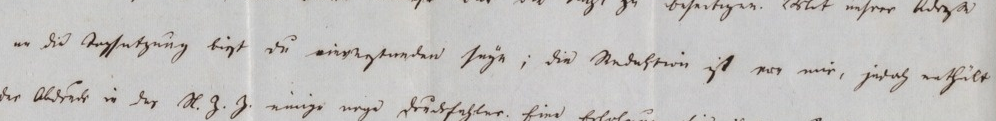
an die Tagsatzung wirst Du einverstanden seyn; die Redaktion ist von mir, jedoch enthält
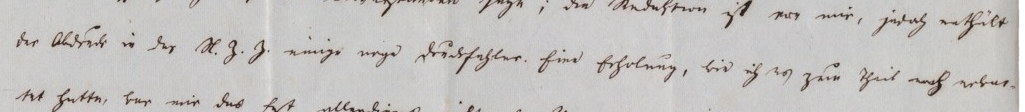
der Abdruck in der N.Z.Z. einige arge Druckfehler. Eine Erholung, wie ich es zum Theil noch erwar-
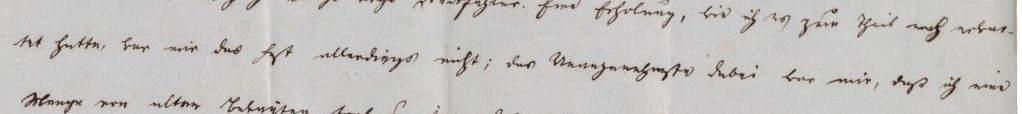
tet hatte, war mir das Fest allerdings nicht; das Unangenehmste dabei war mir, daß ich eine
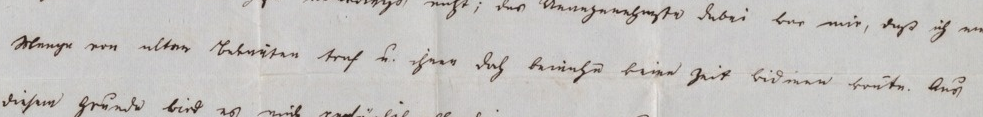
Menge von alten Bekannten traf u. ihnen doch beinahe keine Zeit widmen konnte. Aus
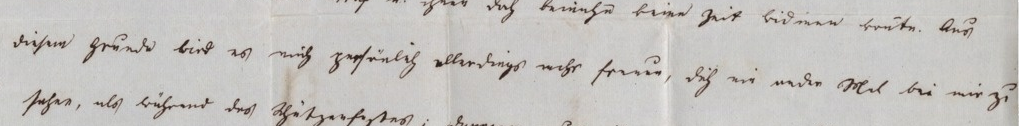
diesem Grunde wird es mich persönlich allerdings mehr freuen, Dich ein ander Mal bei mir zu
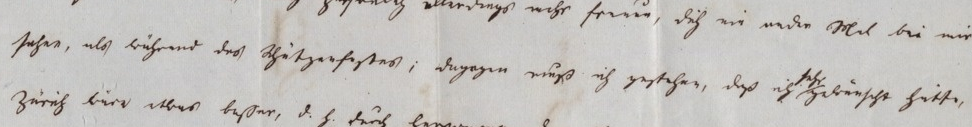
sehen, als während des Schützenfestes; dagegen muß ich gestehen, daß ich sehr gewünscht hätte,
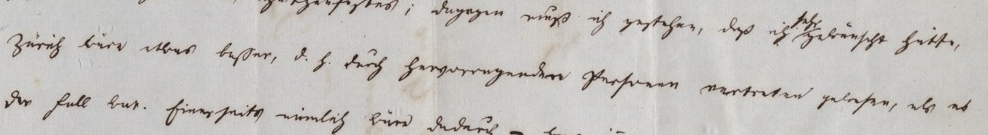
Zürich wäre etwas besser, d. h. durch hervorragendere Personen vertreten gewesen, als es
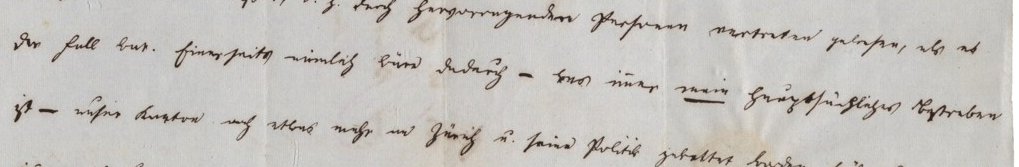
der Fall war. Einerseits nämlich wäre dadurch – was immer mein hauptsächliches Bestreben
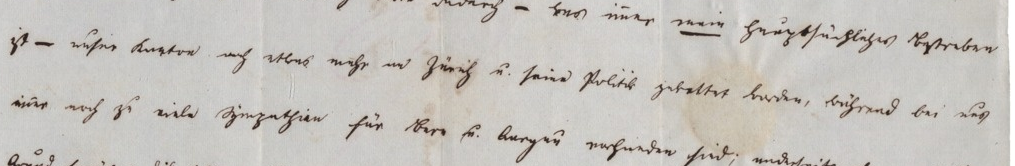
ist – unser Kanton noch etwas mehr an Zürich u. seine Politik gekettet worden, während bei uns
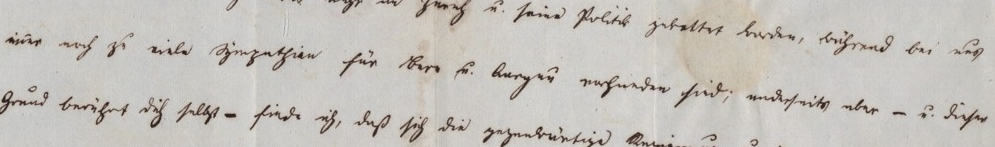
immer noch zu viele Sympathien für Bern u. Aargau vorhanden sind; anderseits aber – u. dieser
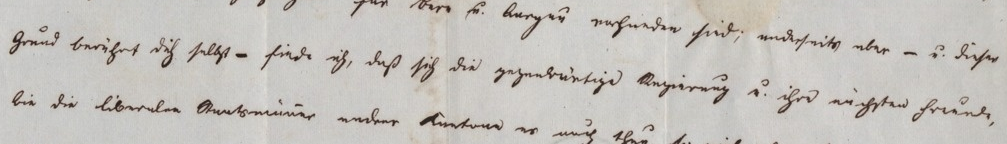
Grund berührt Dich selbst – finde ich, daß sich die gegenwärtige Regierung u. ihre nächsten Freunde,
